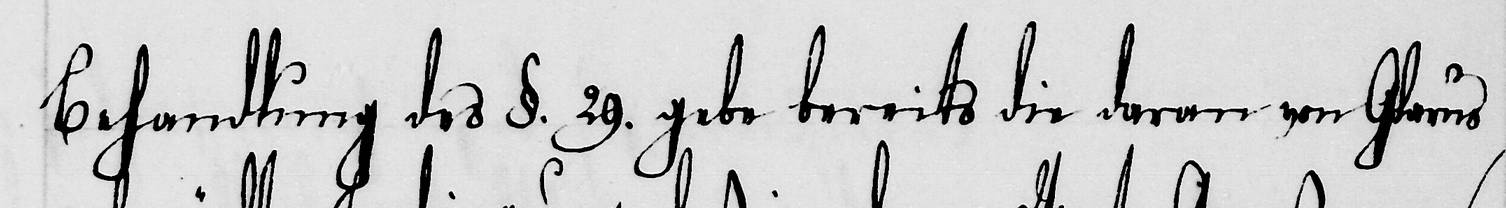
Behandlung des §. 29. gebe bereits die daran von Glar¬
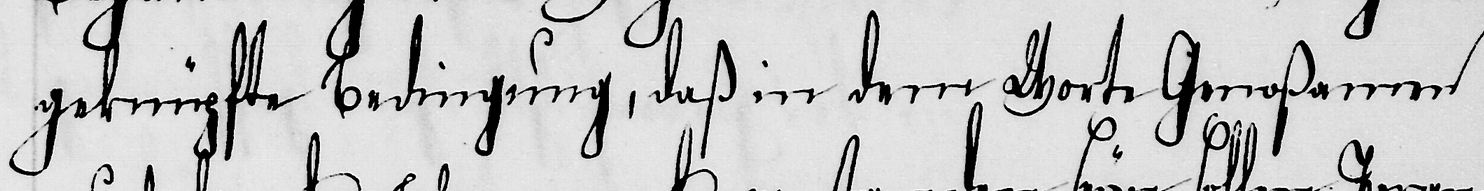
geknüpfte Bedingung, daß in dem Worte Genoßamen
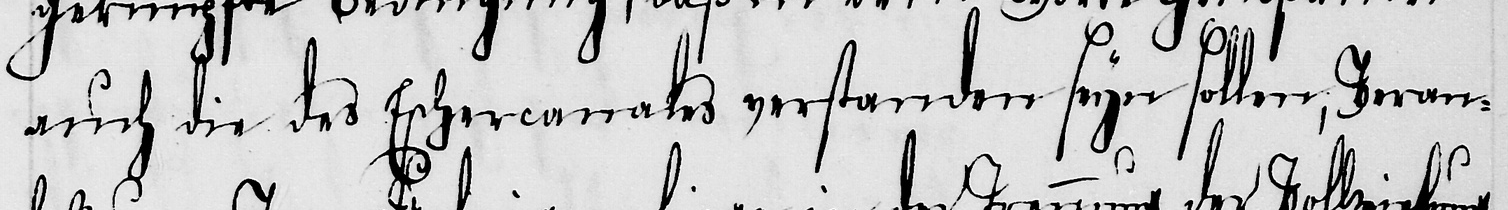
auch die des Eschercanales verstanden seyn sollen, Veran¬
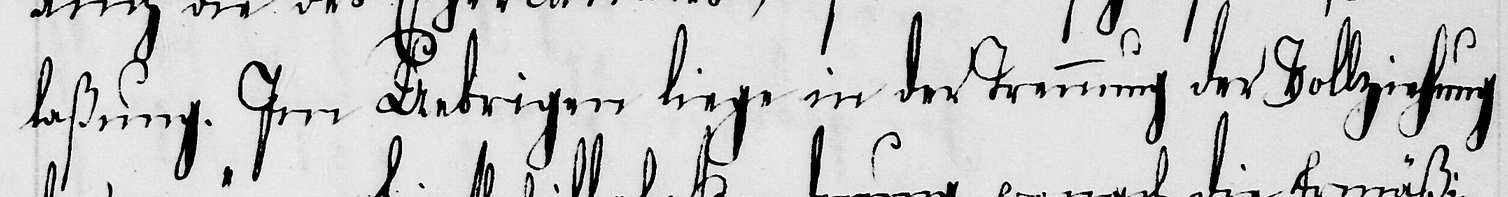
laßung. Im Uebrigen liege in der Trennung der Vollziehung
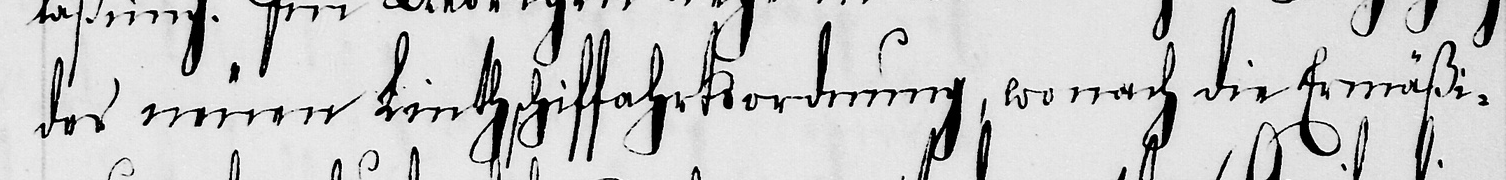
der neuen Linthschiffahrtsordnung, wonach die Ermäßi¬
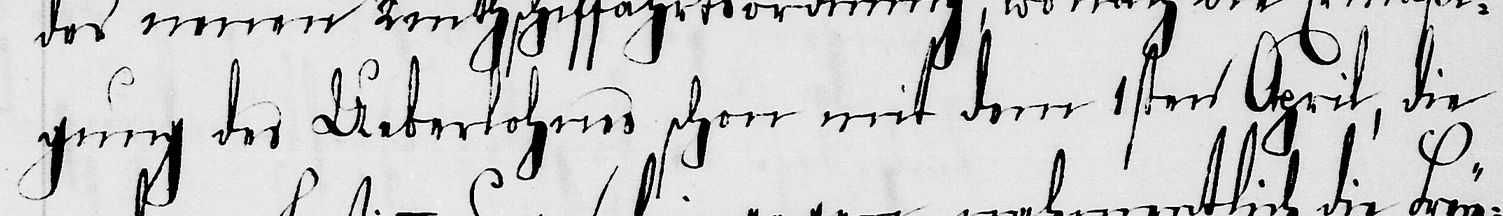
gung des Ueberlohnes schon mit dem 1sten April, die
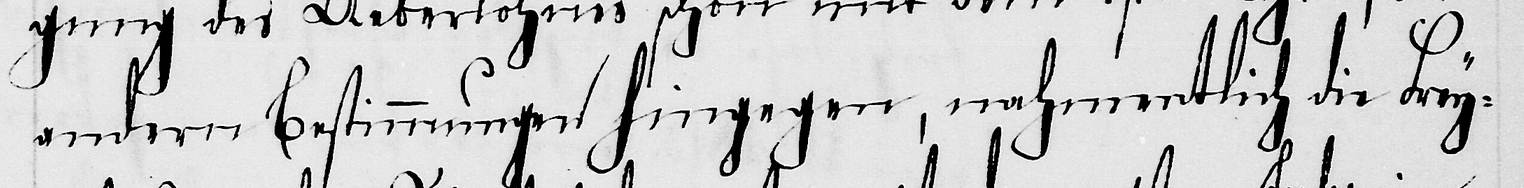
andern Bestimmungen hingegen, nahmentlich die Frey¬
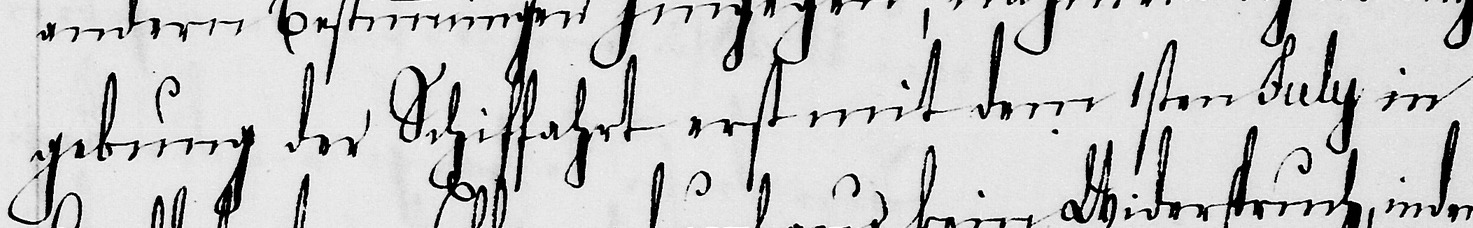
gebung der Schiffahrt erst mit dem 1sten July in
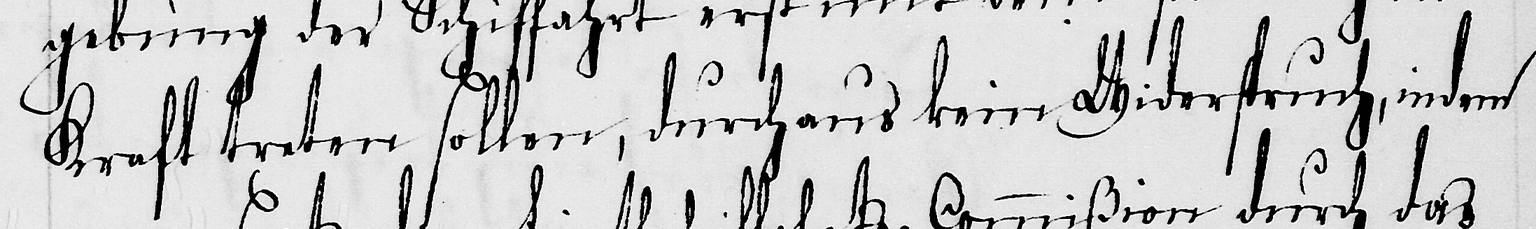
Kraft treten sollen, durchaus kein Widerspruch, indem
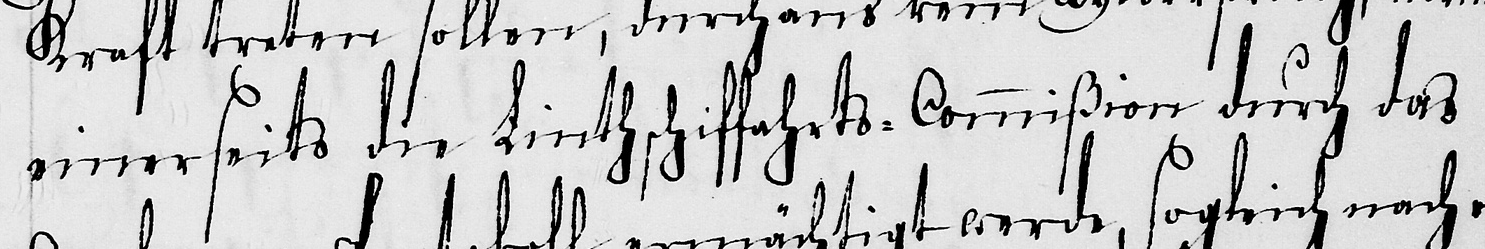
einerseits die Linthschiffahrts-Commißion durch das
